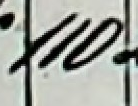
110
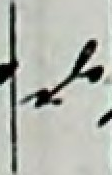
do
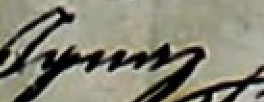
Ignaz
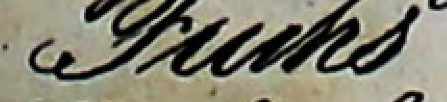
Fuchs
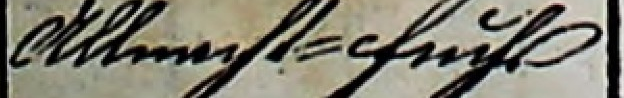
Altnacht=Fuchs
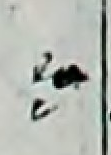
do
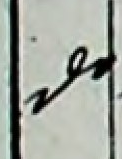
do
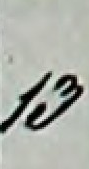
13
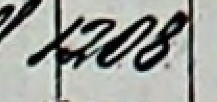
1208
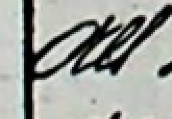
Alt
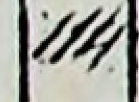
114
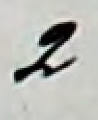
2
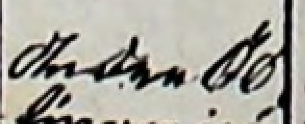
An der Ös„
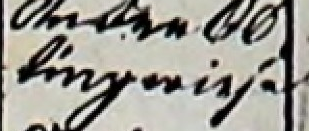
lingwiese
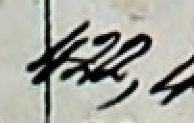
422,4
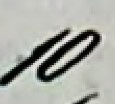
10
